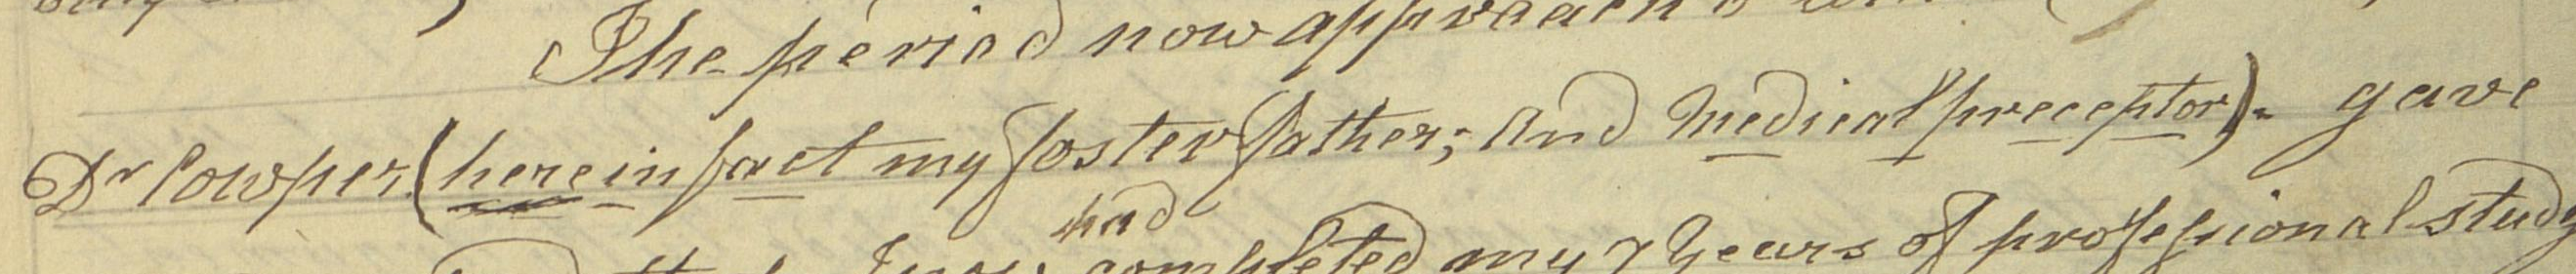D^r Cowper (here in fact my foster father; and Medical preceptor) gave
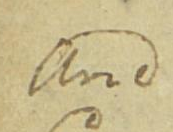And
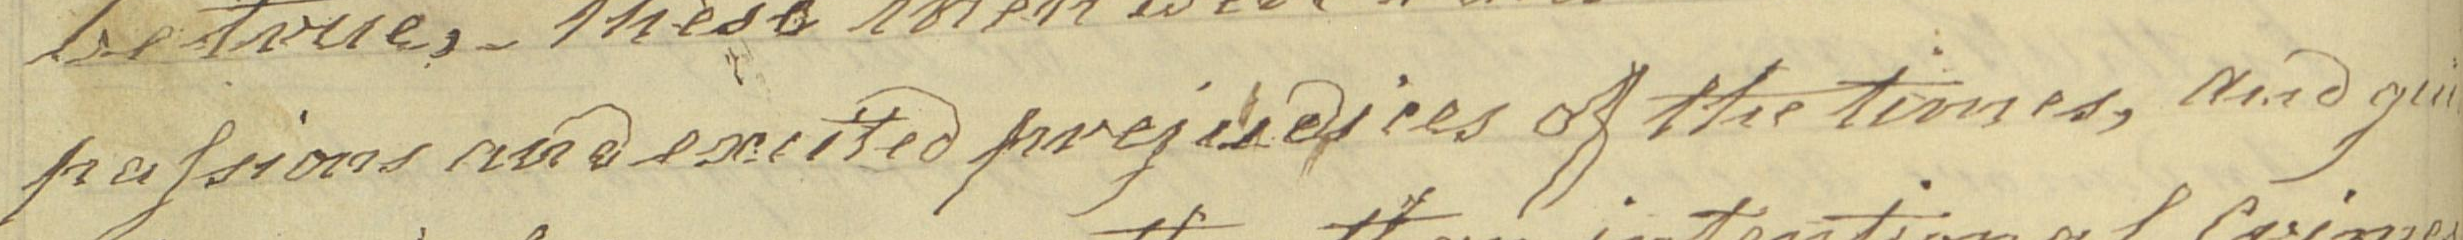passions and excited prejudices of the times, and gu-
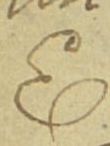E
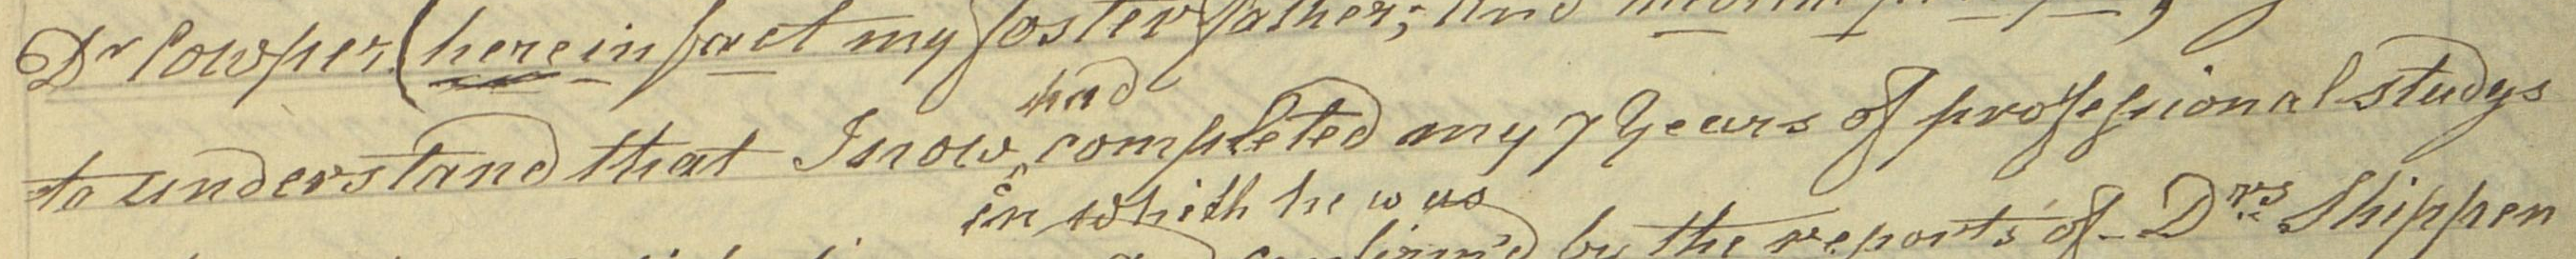to understand that I now ^completed my 7 Years of professional studys
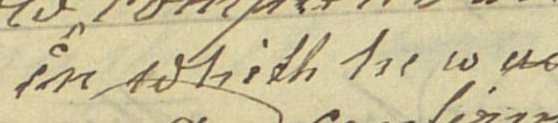in which he was
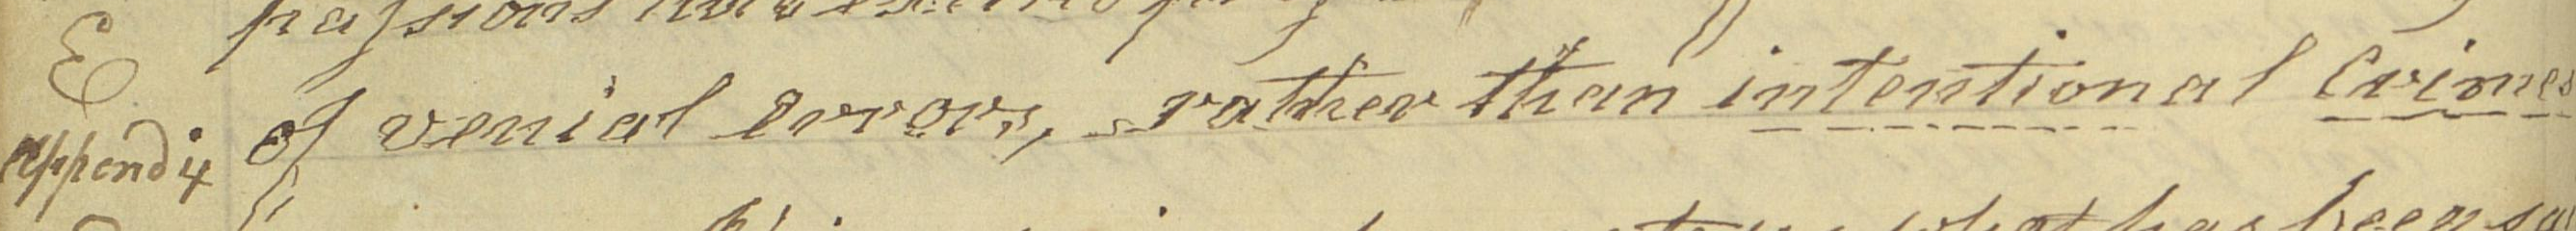Appendix of venial errors rather than intentional Crimes
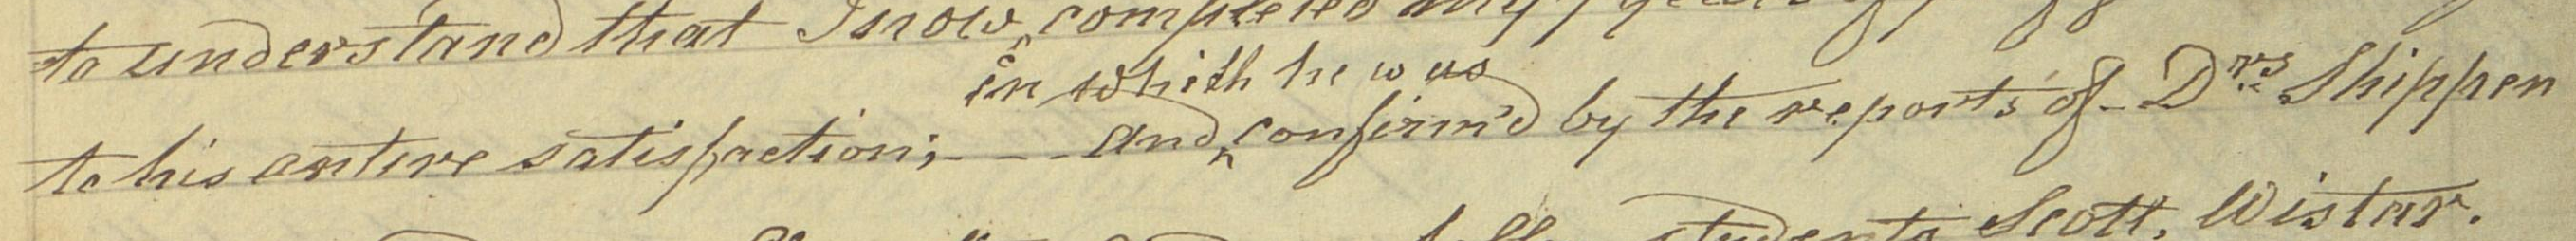to his entire satisfaction; and ^ Confirm'd by the reports of D^rs. Shippen
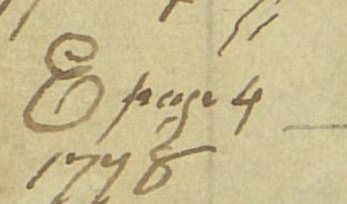E page 4
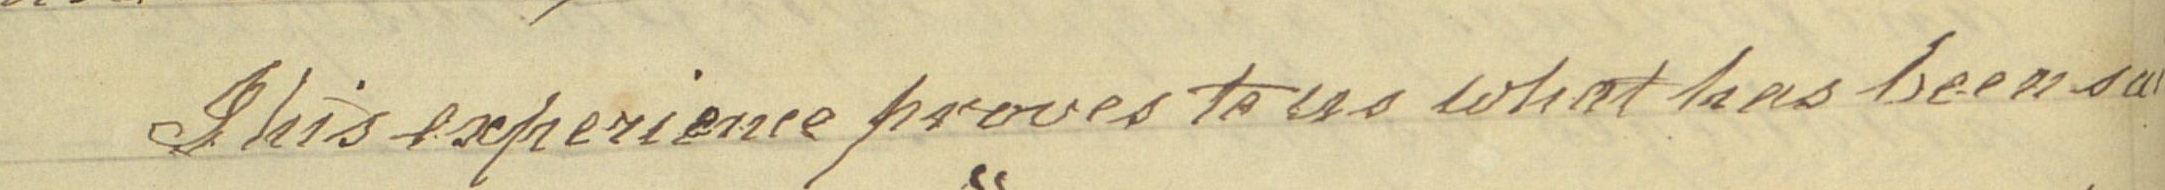This experience proves to us what has been sai-
